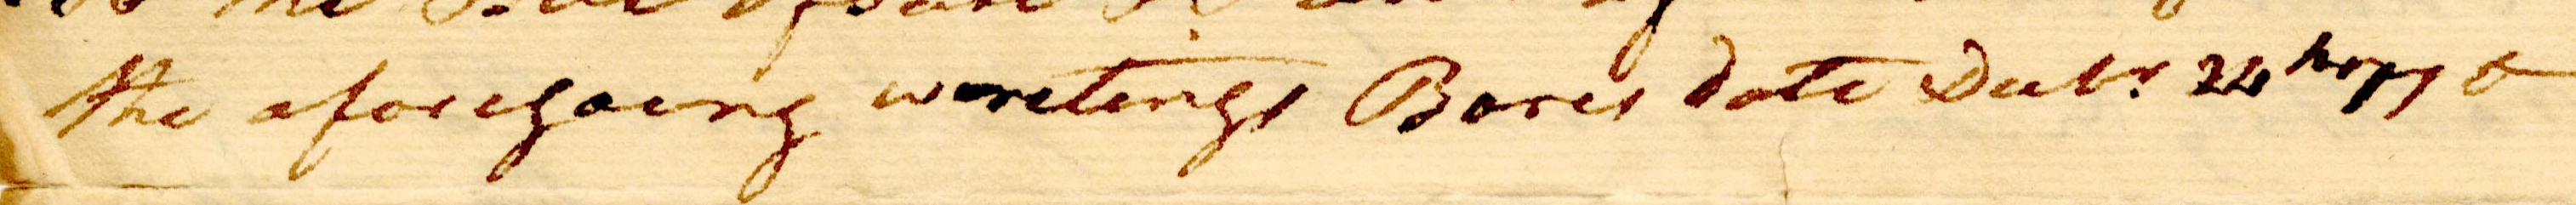the aforgoing writings bores date Decb^r 24^th 1778
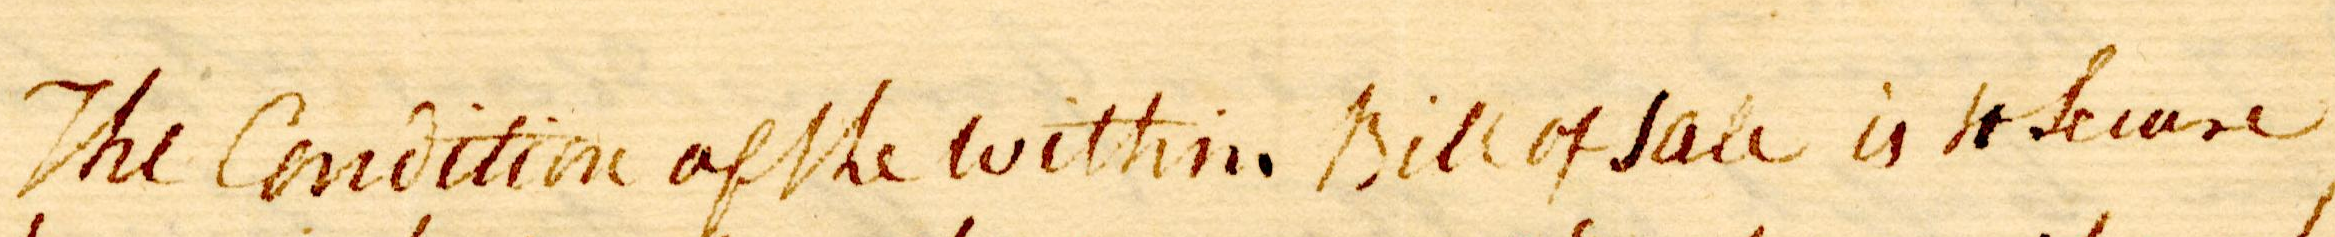The Condition of the within Bill of Sale is to secure
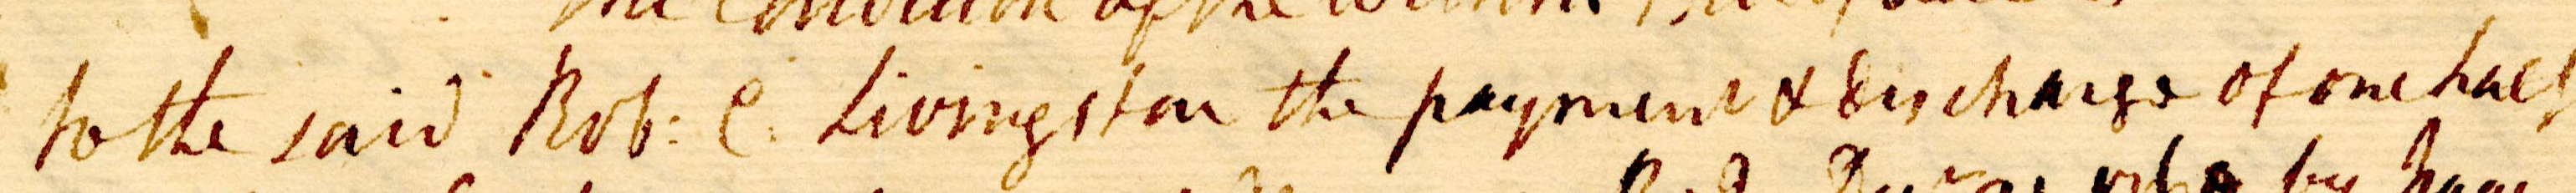to the said Rob. C Livingston the payment & Exchange of one half
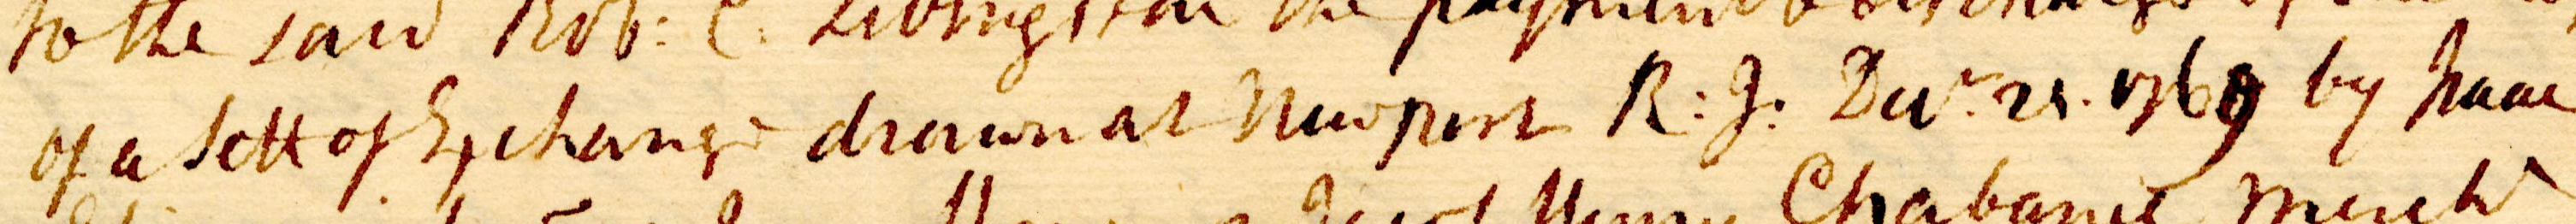of a sett of Exchanges down at Newport R: I: Dec^r. 25. 1769 by Isaac
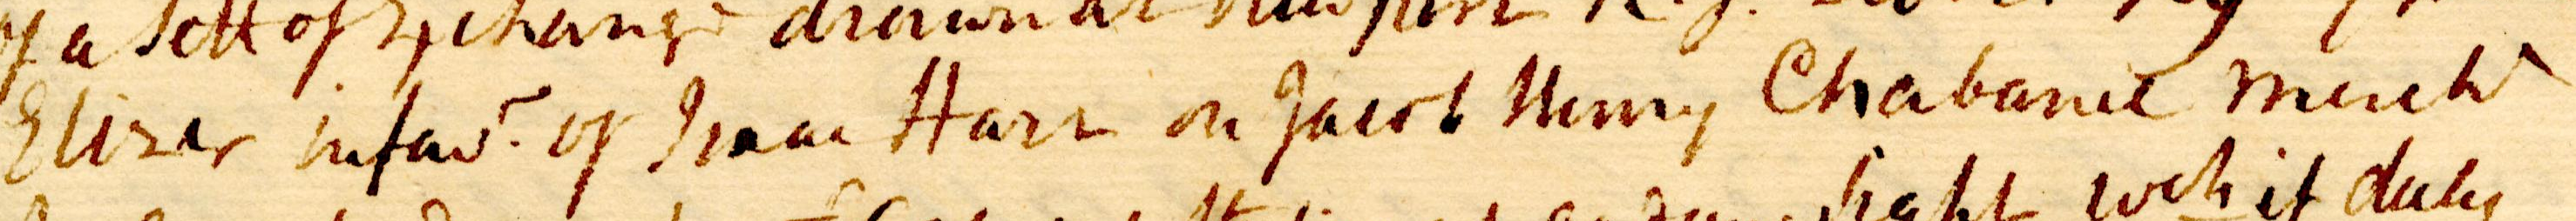Elizer in fav^r. of Isaac Hart on Jacob many Chabanel merch^t
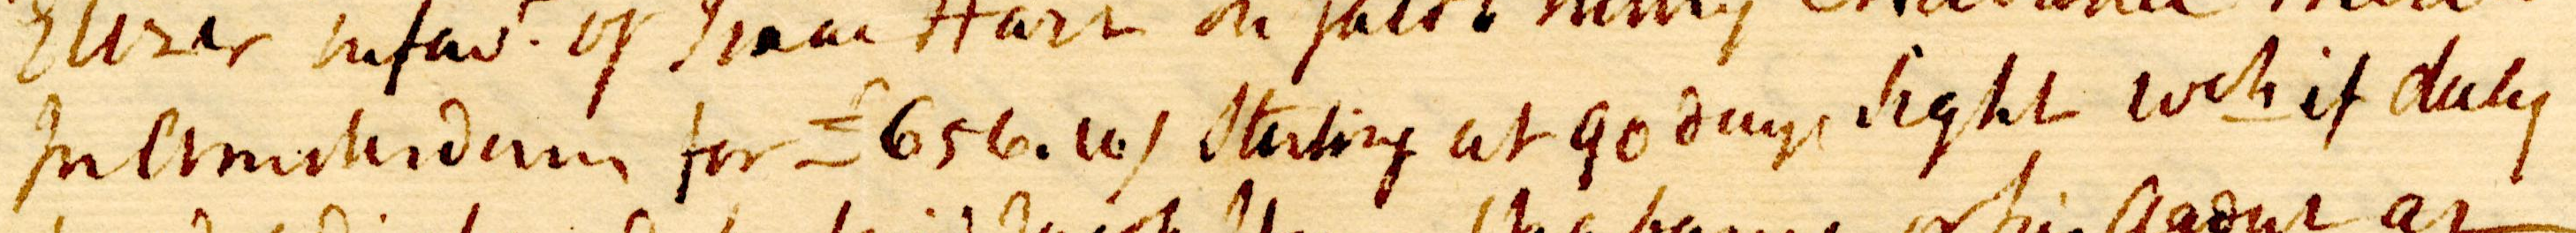in Amsterdam for £656.10s Sterling at 90 days Sight w^ch if duly
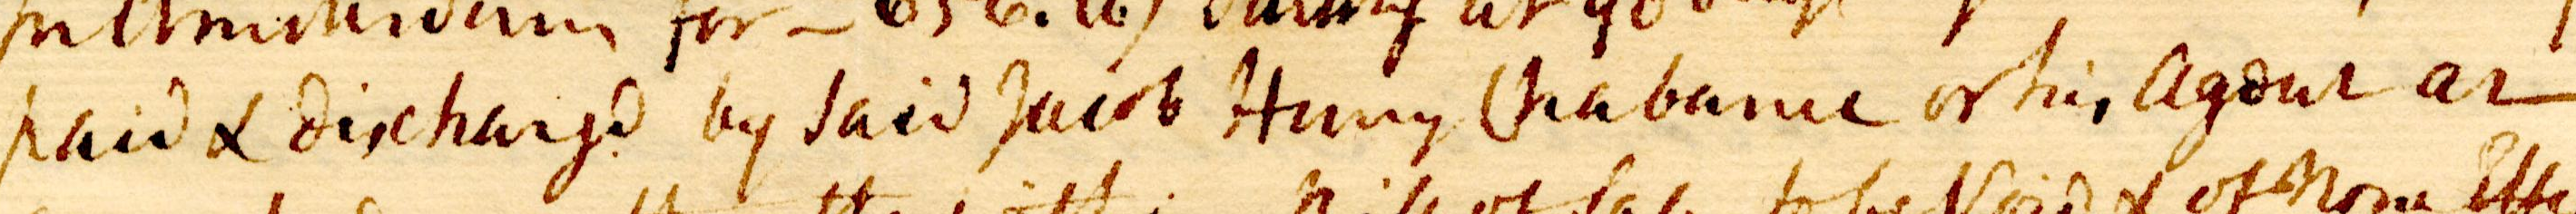paid & discharg'd by said Jacob Henry Chabanel or his Agent as
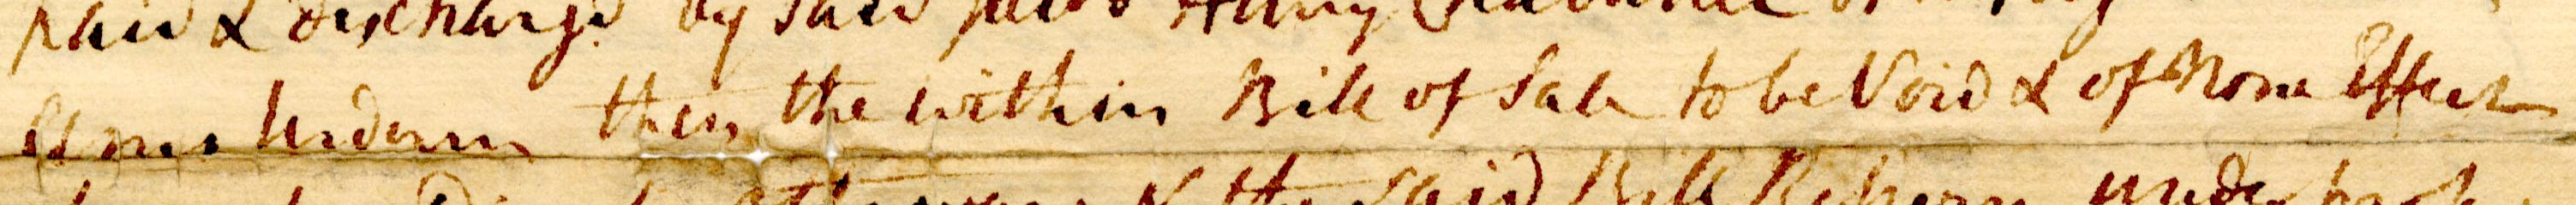Amsterdam then the within Bill of sale to be Void & of None Effet
